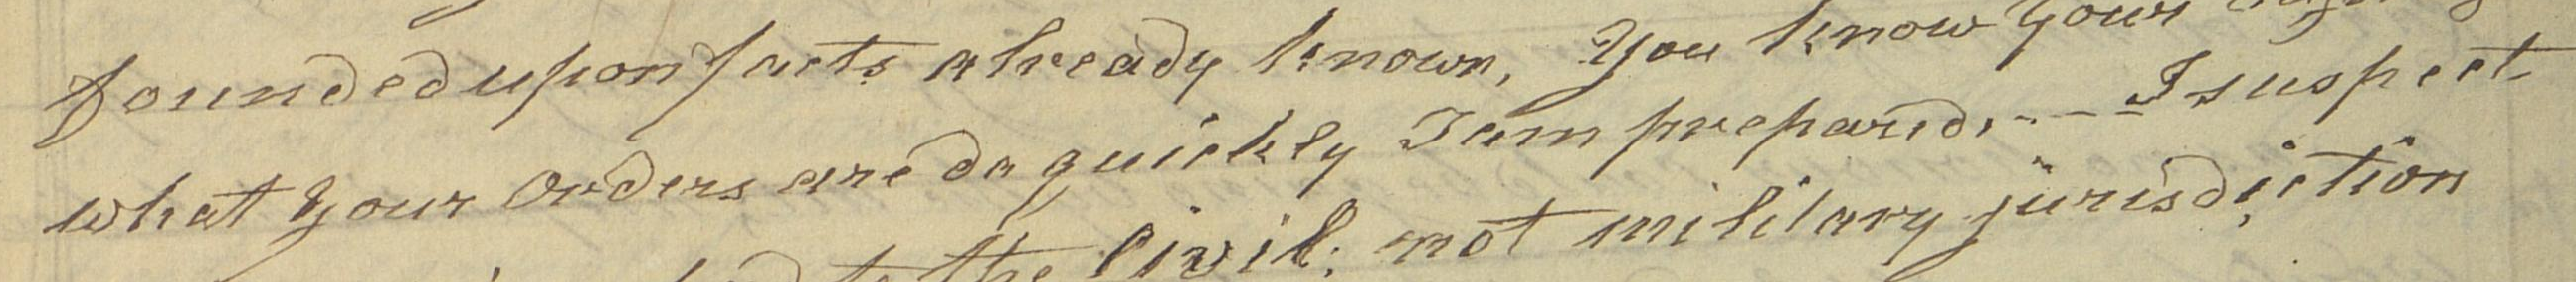what your orders are do quickly I am prepared, I suspect
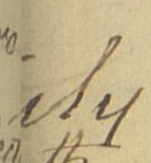-ily
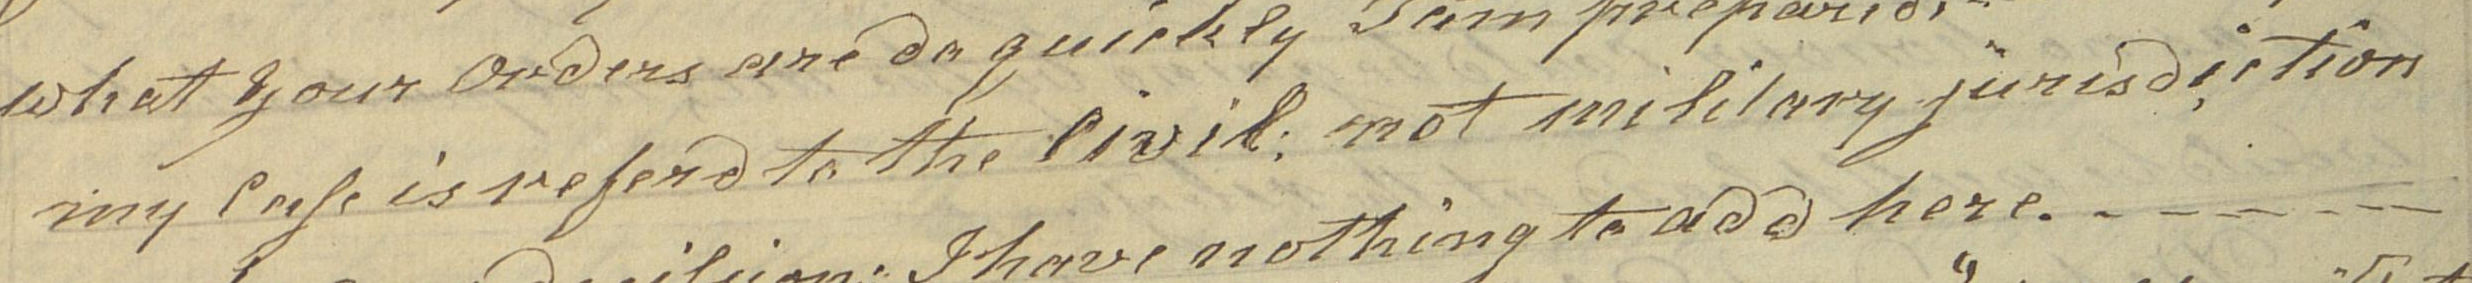my Case is referd to the civil; not military jurisdiction
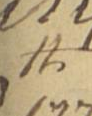th
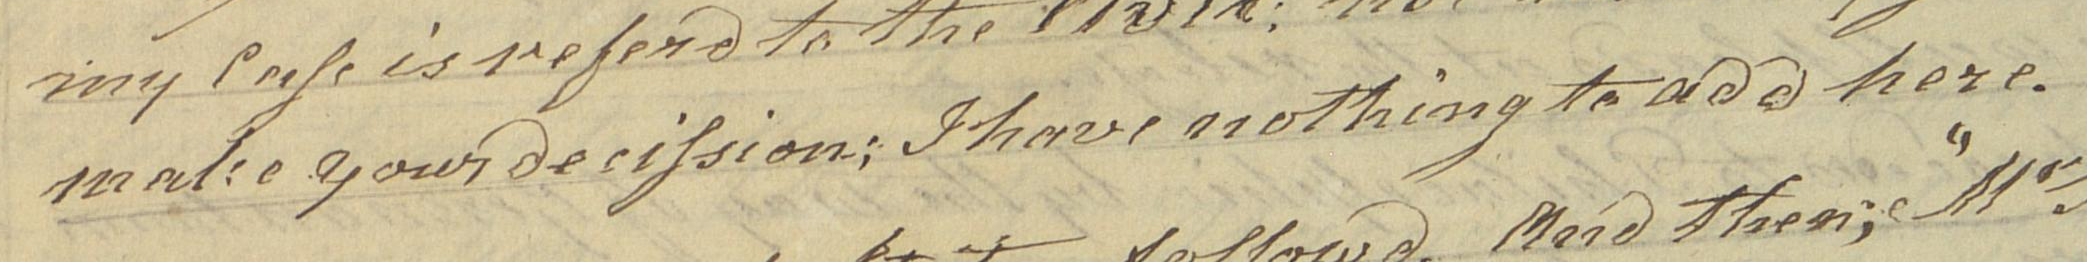make your decission; I have nothing to add here.
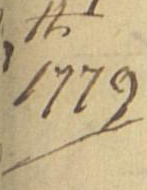1779
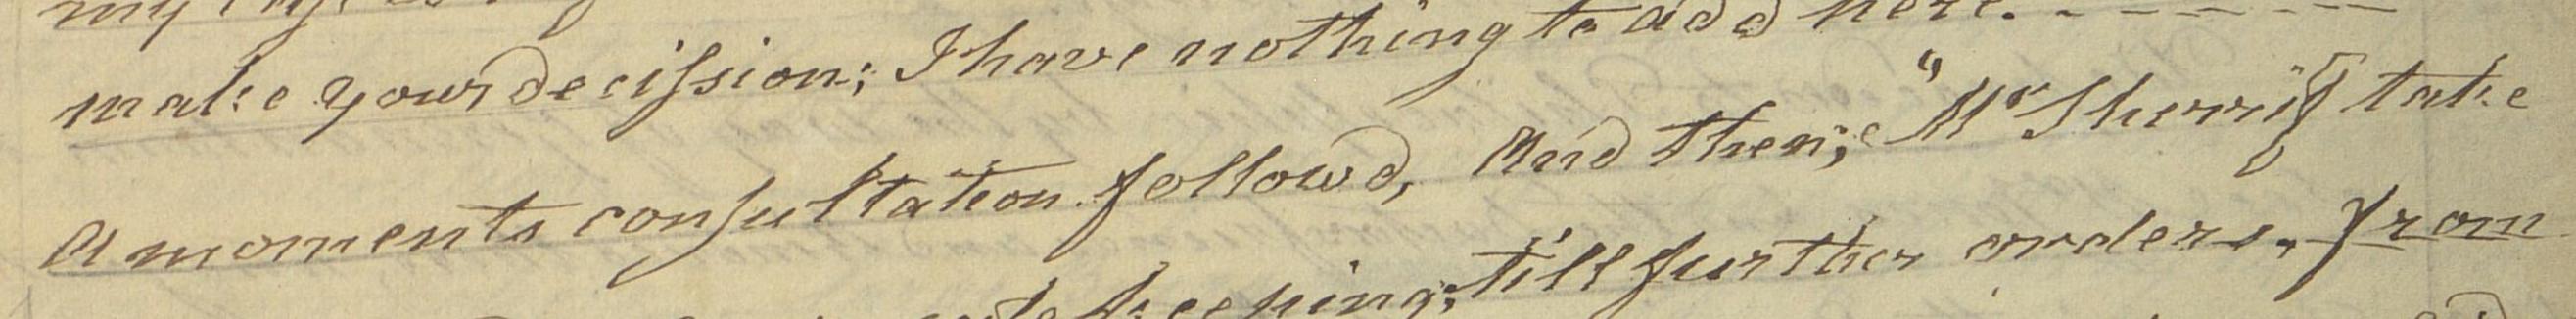A moments consultation followd, and then; M^r. Morris take
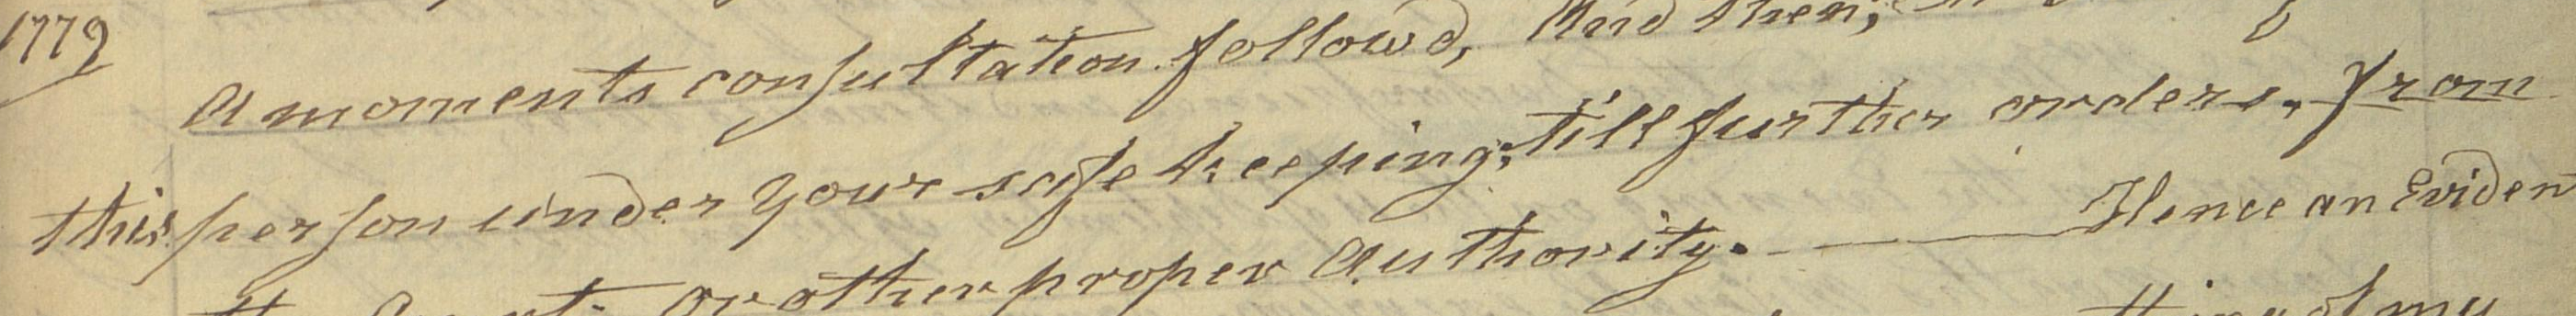this persons under your safe keeping; till further orders, from
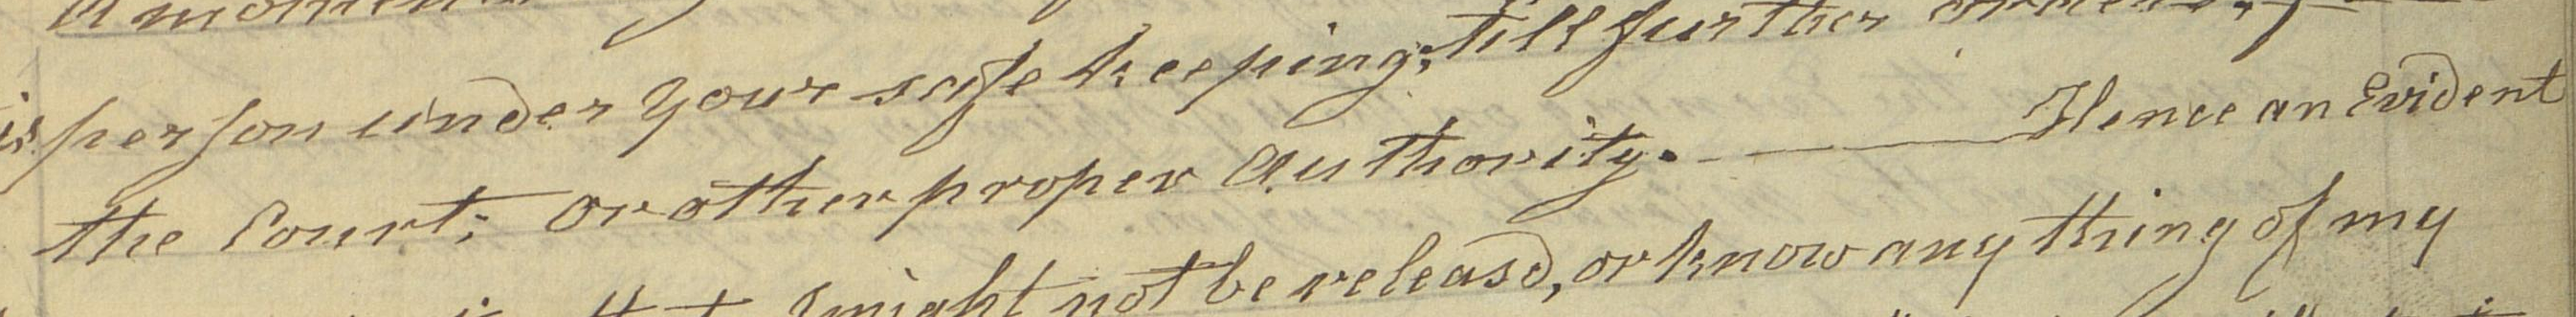the Court: or other proper authority. Hence an Evident
